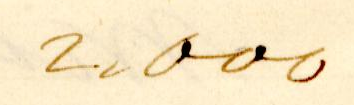2,000
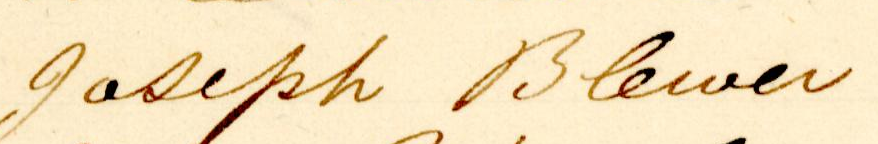Joseph Blewer
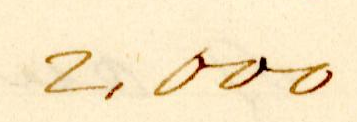2,000
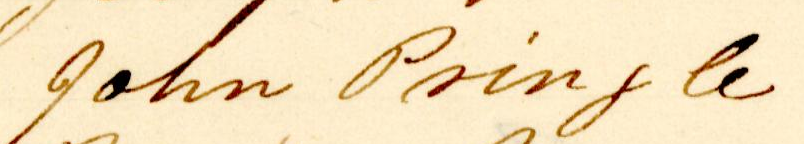John Pringle
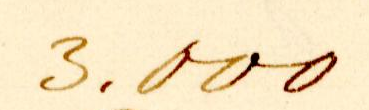3,000
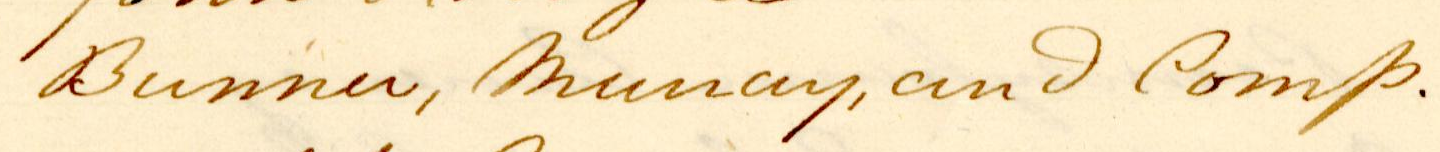Bunner, Murray, and Comp.
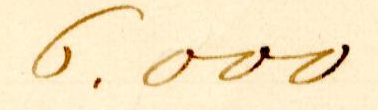6,000
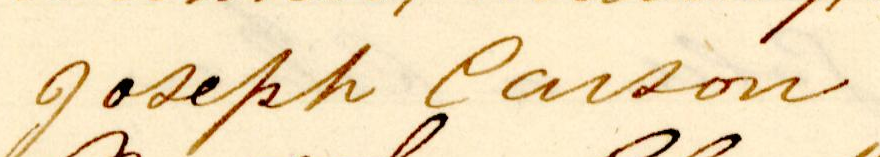Joseph Carson
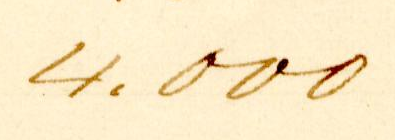4,000
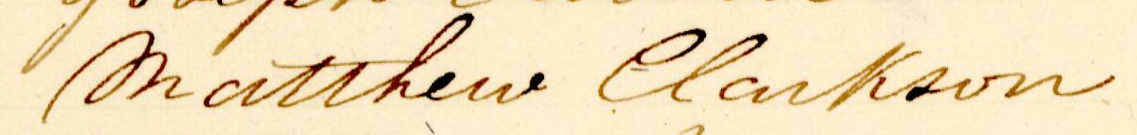Matthew Clarkson
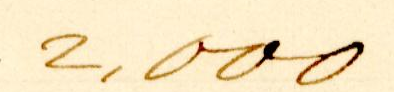2,000
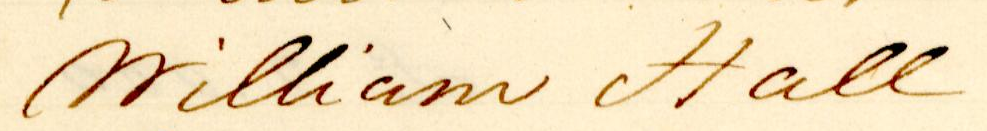William Hall
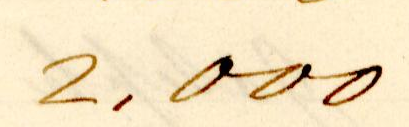2,000
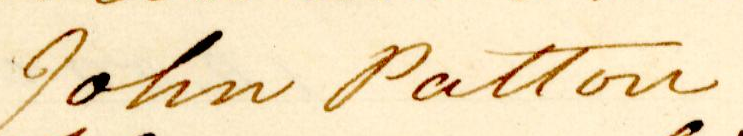John Patton
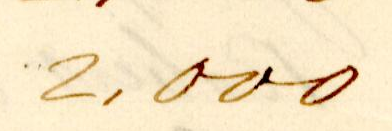2,000
